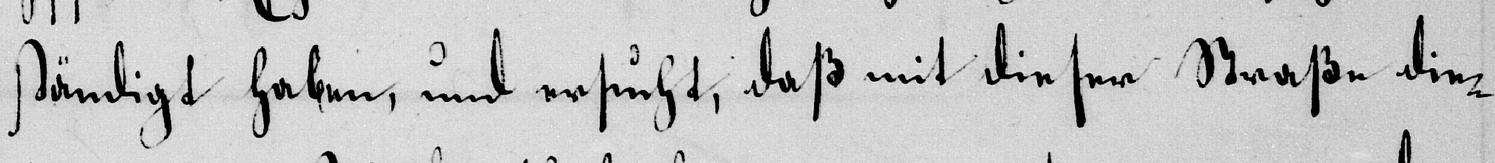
ständigt haben, und ersucht, daß mit dieser Straße die¬
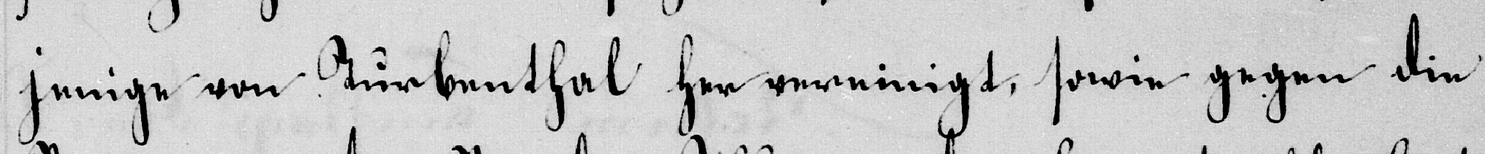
jenige von Turbenthal her vereinigt, sowie gegen die
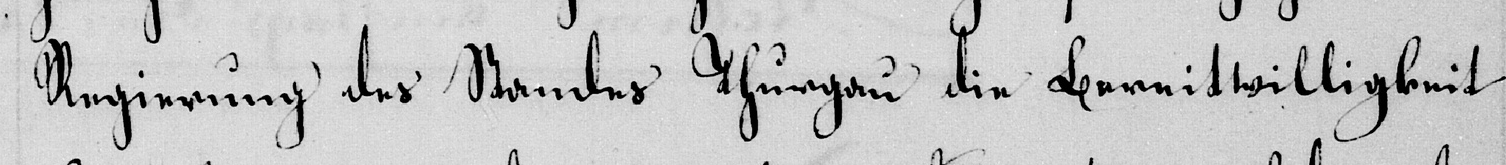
Regierung des Standes Thurgau die Bereitwilligkeit
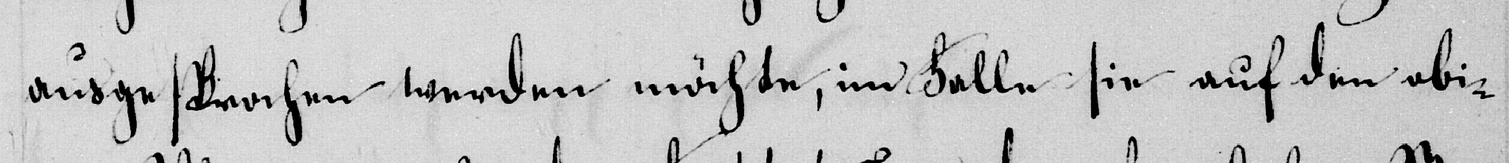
ausgesprochen werden möchte, im Falle sie auf den obi¬
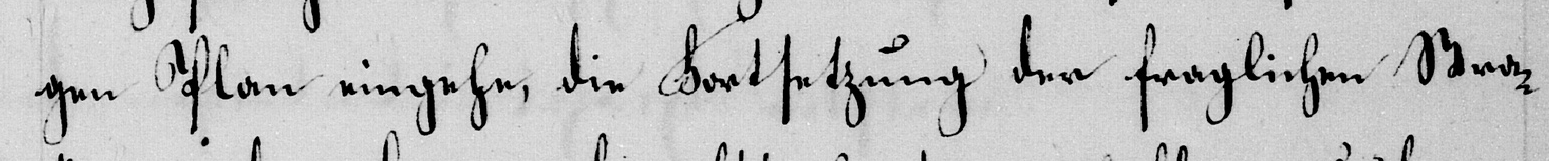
gen Plan eingehe, die Fortsetzung der fraglichen Stra¬
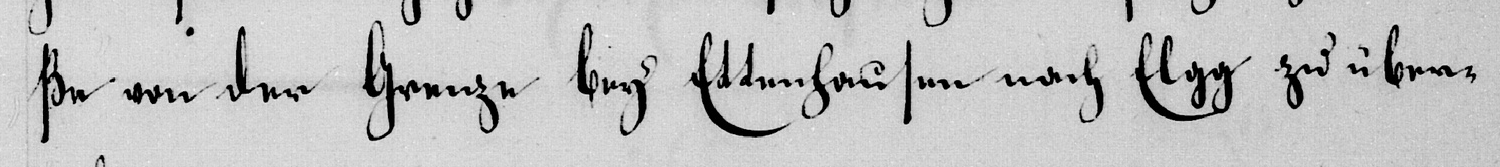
ße von der Grenze bey Ettenhausen nach Elgg zu über¬
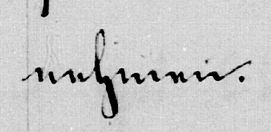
nehmen.
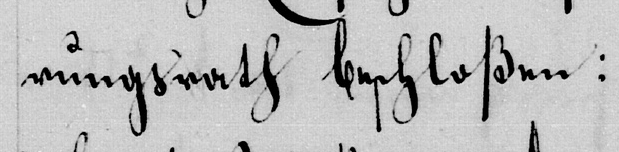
rungsrath beschloßen:
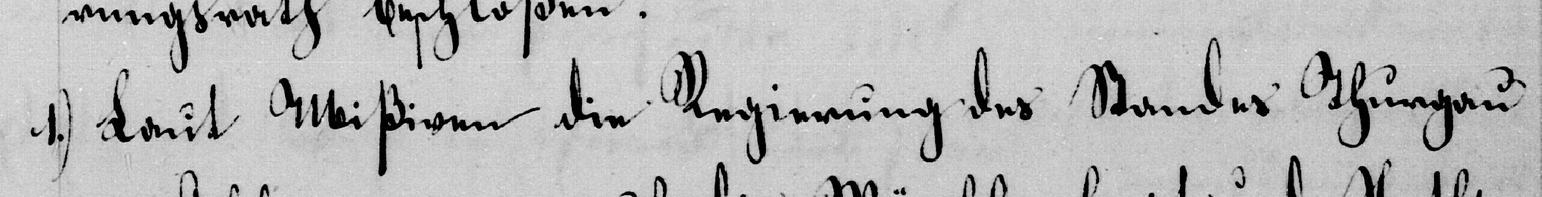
1.) Laut Mißiven die Regierung des Standes Thurgau
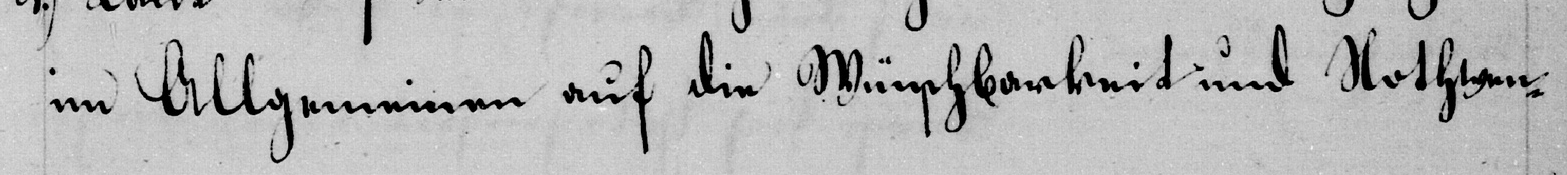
im Allgemeinen auf die Wünschbarkeit und Nothwen-
